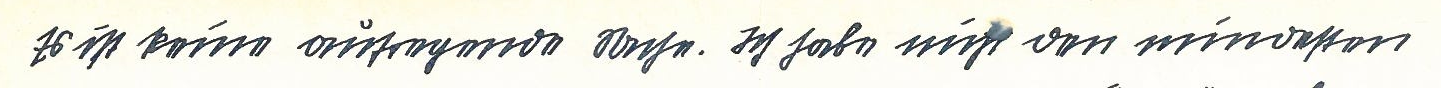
Es ist keine aufregende Sache. Ich habe nicht den mindesten
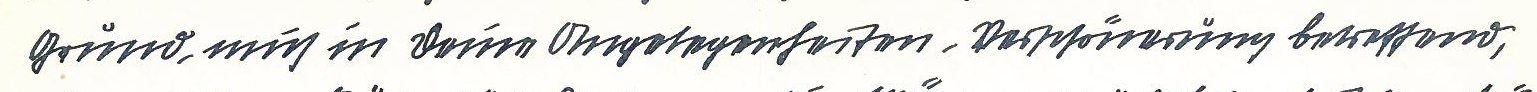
Grund, mich in Deine Angelegenheiten, Verschönerung betreffend,
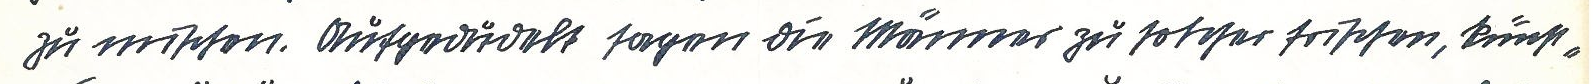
zu mischen. Aufgedudelt sagen die Männer zu solcher frischen, künst¬
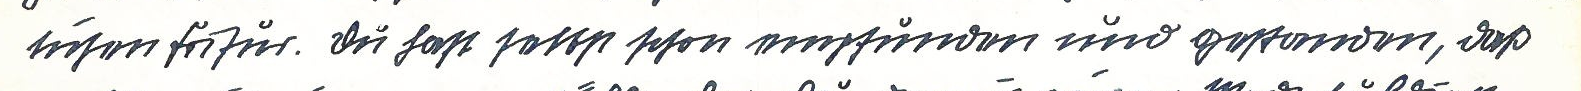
lichen Frisur. Du hast selbst schon empfunden und gestanden, daß
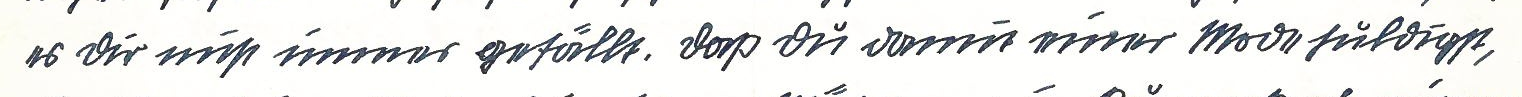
es Dir nicht immer gefällt. Daß Du damit einer Mode huldigst,
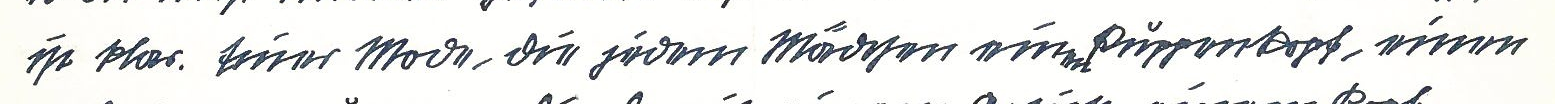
ist klar. Einer Mode, die jedem Mädchen einen Puppenkopf,
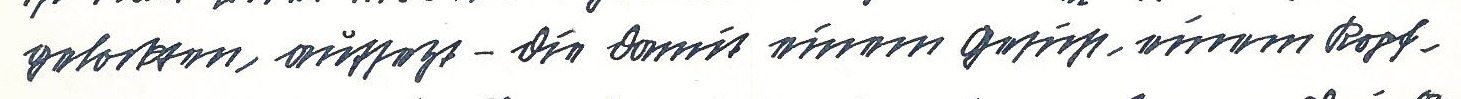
einen gelockten, aufsetzt – die damit einem Gesicht, einem Kopf,
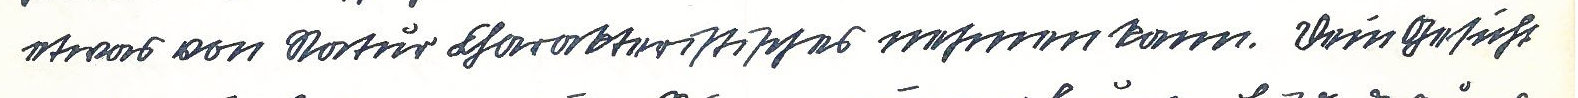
etwas von Natur Charakteristisches nehmen kann. Dein Gesicht
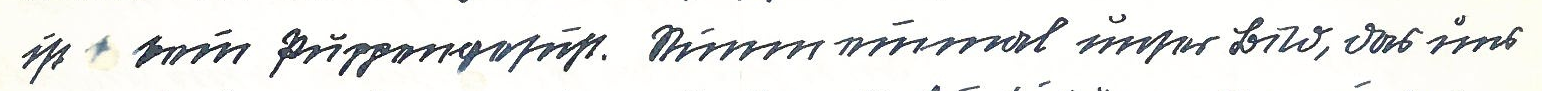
ist kein Puppengesicht. Nimm einmal unser Bild, das uns
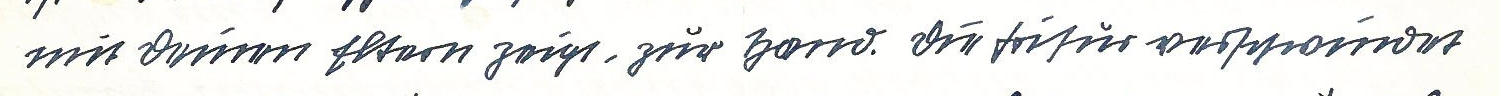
mit Deinen Eltern zeigt, zur Hand. Die Frisur verschwindet
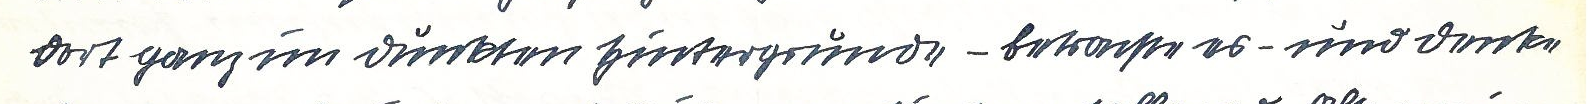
dort ganz im dunklen Hintergrunde – betrachte es – und denke
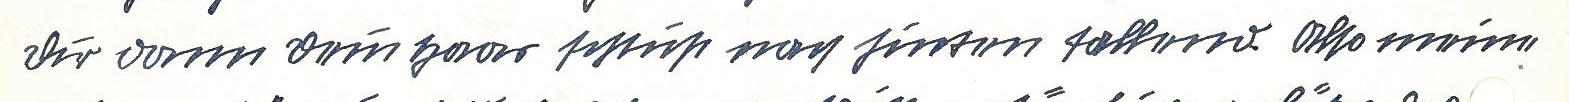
Dir dann Dein Haar schlicht nach hinten fallend. Also meine
